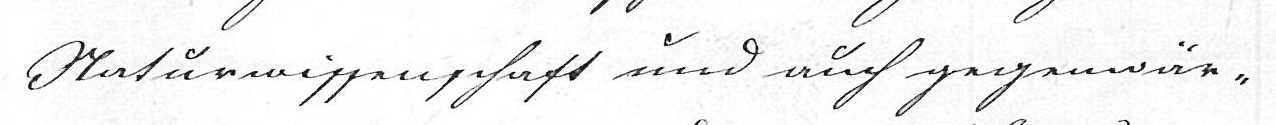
Naturwissenschaft und auch gegenwär-
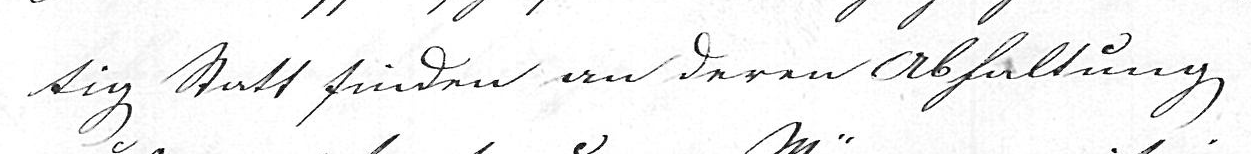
tig Statt finden an deren Abhaltung
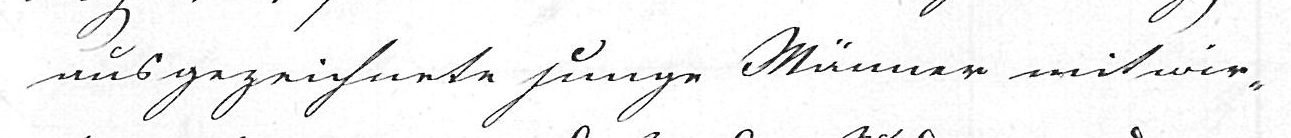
ausgezeichnete junge Männer mitwir-
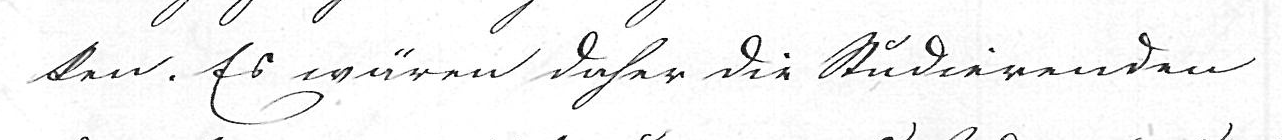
ken. Es wären daher die Studierenden
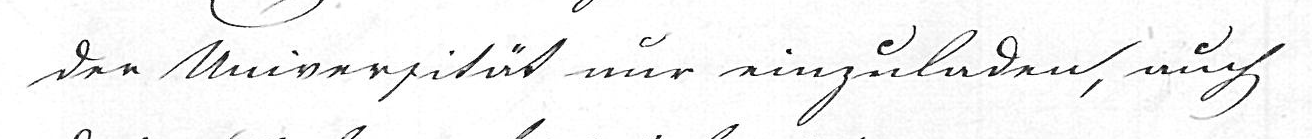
der Universität nur einzuladen, auch
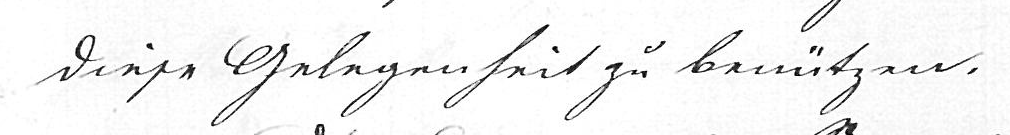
diese Gelegenheit zu benützen.
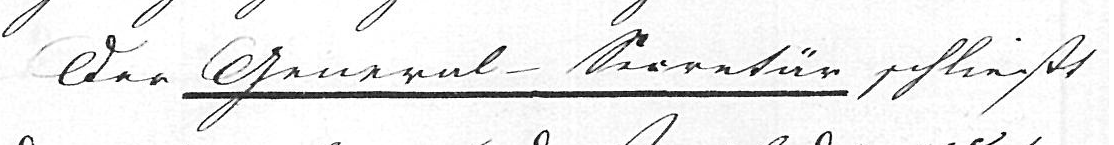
Der General-Secretär schließt
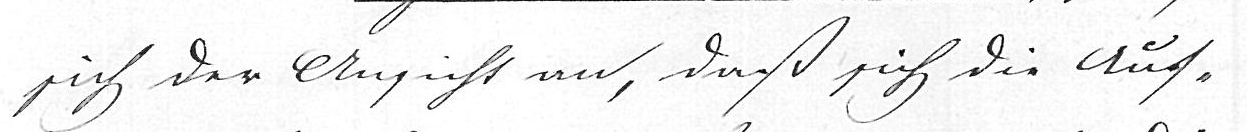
sich der Ansicht an, daß sich die Auf-
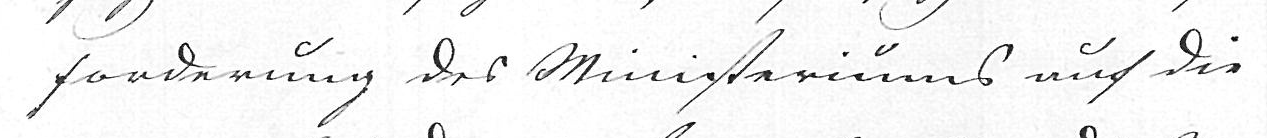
forderung des Ministeriums auf die
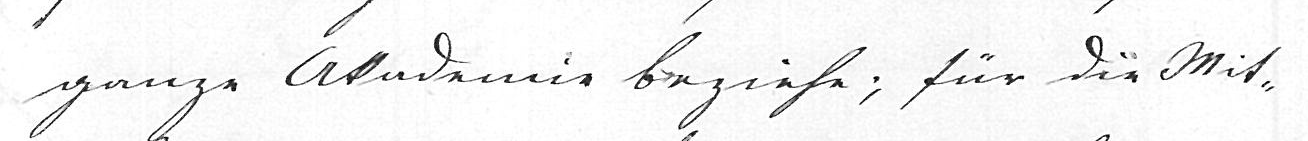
ganze Akademie beziehe; für die Mit-
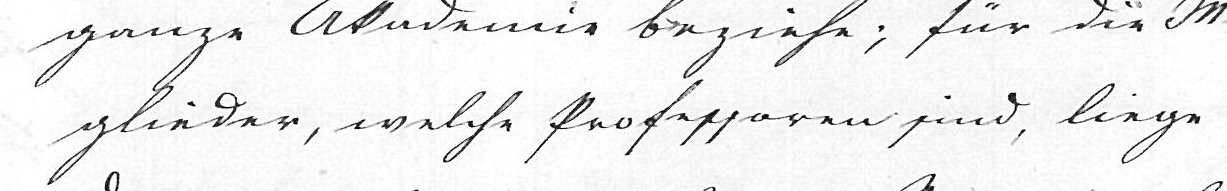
glieder, welche Professoren sind, liege
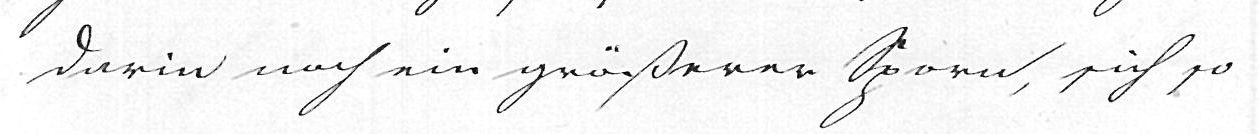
darin noch ein größerer Sporn, sich so
